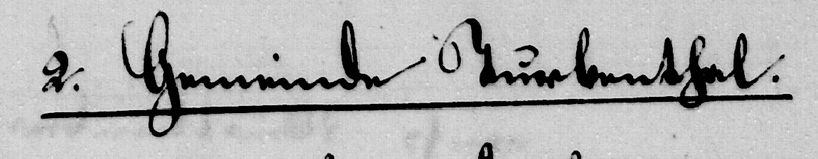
2. Gemeinde Turbenthal.
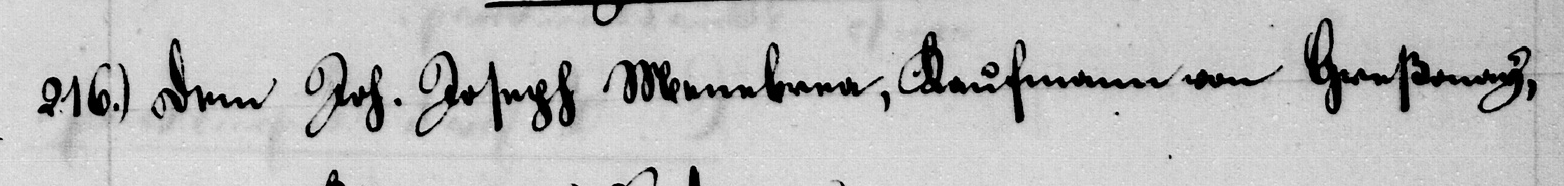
216.) Dem Joh. Joseph Menebrea, Kaufmann von Greßonay,
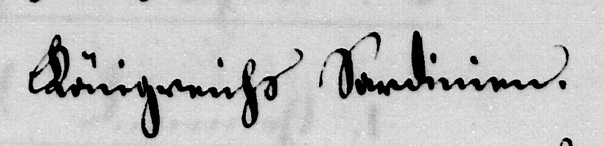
Königreichs Sardinien.
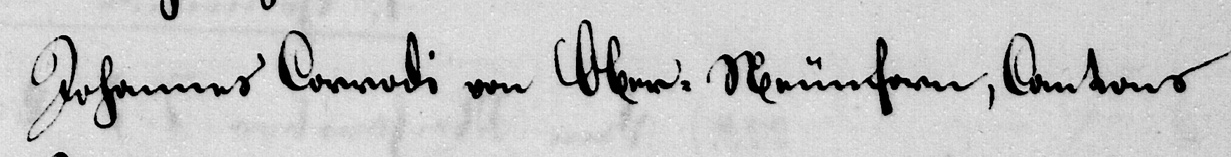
Johannes Corrodi von Ober-Neunforn, Cantons
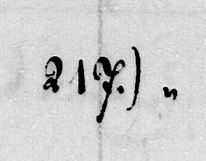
219.) “
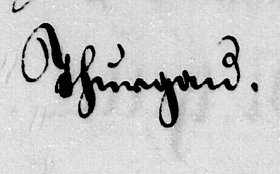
Thurgau.
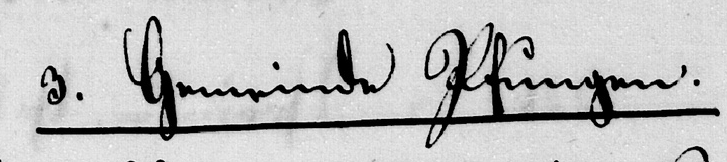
3. Gemeinde Pfungen.
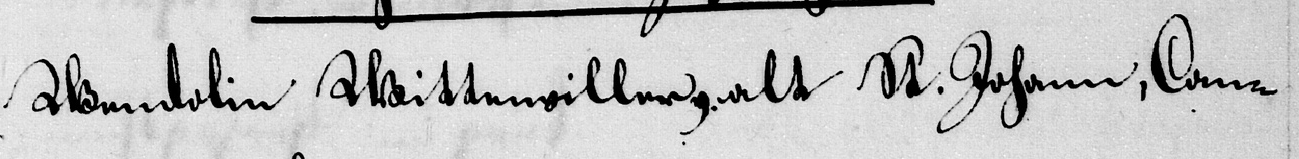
Wendelin Wittenviller v. alt St. Johann, Can¬
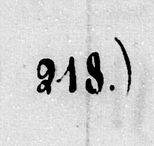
218.)
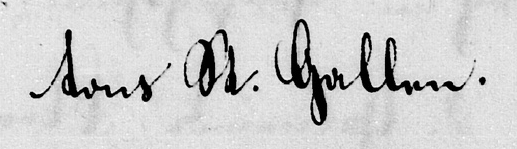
tons St. Gallen.
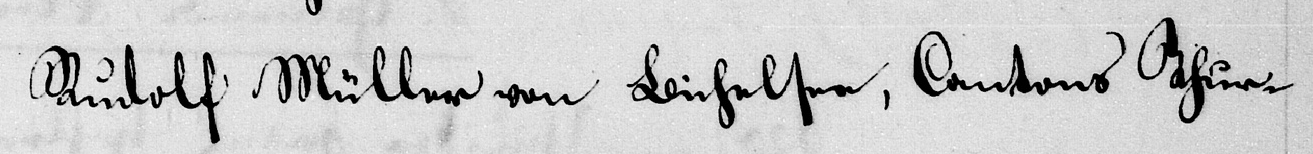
Rudolf Müller von Bichelsen, Cantons Thur¬
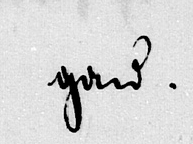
gau.
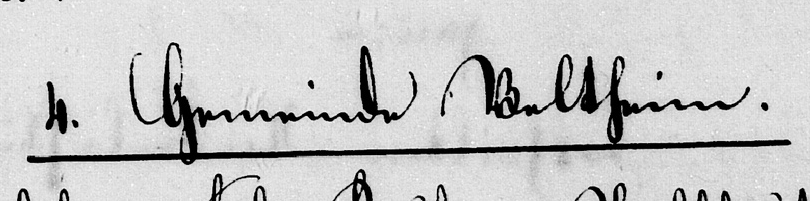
4. Gemeinde Veltheim.
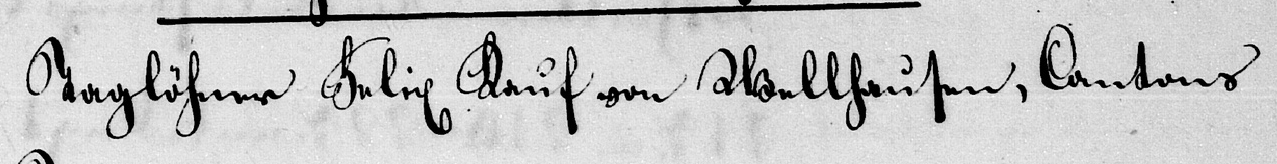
Taglöhner Felix Kauf von Wellhausen, Cantons
